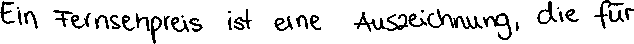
Ein Fernsehpreis ist eine Auszeichnung, die für
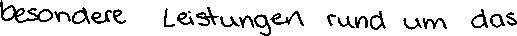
besondere Leistungen rund um das
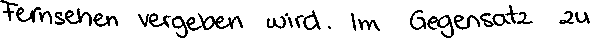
Fernsehen vergeben wird. Im Gegensatz zu
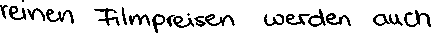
reinen Filmpreisen werden auch
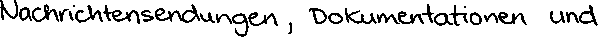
Nachrichtensendungen, Dokumentationen und
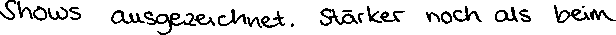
Shows ausgezeichnet. Stärker noch als beim
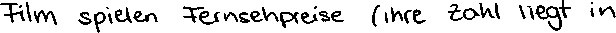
spielen Fernsehpreise (ihre Zahl liegt in
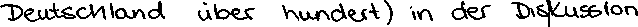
Deutschland über hundert) in der Diskussion
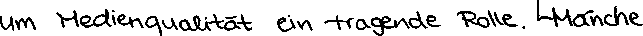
um Medienqualität eine tragende Rolle. Manche
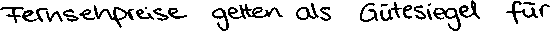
Fernsehpreise gelten als Gütesiegel für
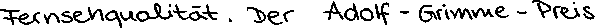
Fernsehqualität. Der Adolf-Grimme-Preis
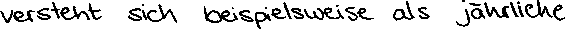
versteht sich beispielsweise als jährliche
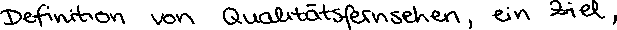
Definition von Qualitätsfernsehen, ein Ziel,
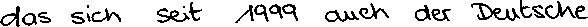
das sich seit 1999 auch der Deutsche
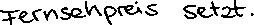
Fernsehpreis setzt.
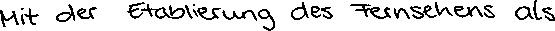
Mit der Etablierung des Fernsehens als
